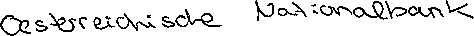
Oesterreichische Nationalbank
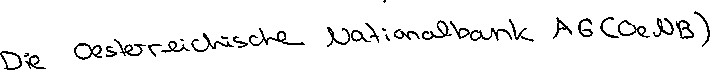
Die Oesterreichische Nationalbank AG (OeNB)
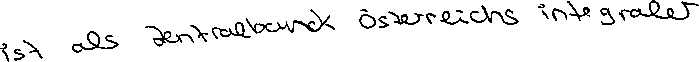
ist als Zentralbank Österreichs integraler
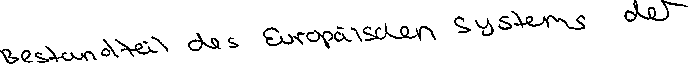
Bestandteil des Europäischen Systems der
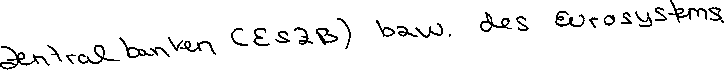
Zentralbanken (ESZB) bzw. des Eurosystems.
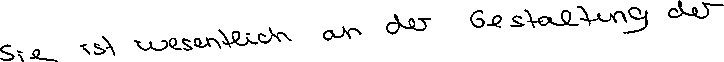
Sie ist wesentlich an der Gestaltung der
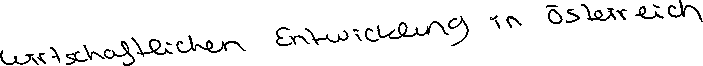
wirtschaftlichen Entwicklung in Österreich
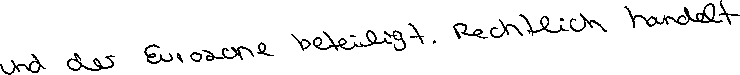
und der Eurozone beteiligt. Rechtlich handelt
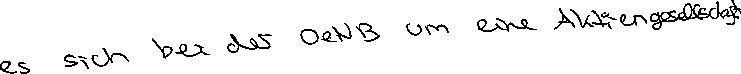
es sich bei der OeNB um eine Aktiengesellschaft.
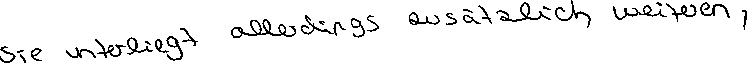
Sie unterliegt allerdings zusätzlich weiteren,
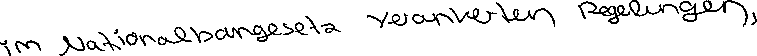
im Nationalbankgesetz verankerten Regelungen,
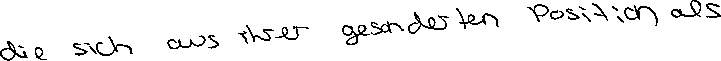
die sich aus ihrer gesonderten Position als
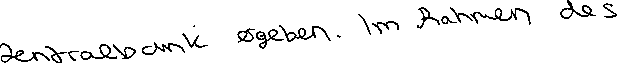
Zentralbank ergeben. Im Rahmen des
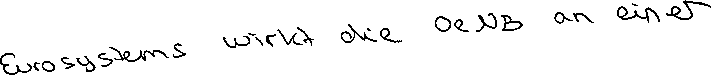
Eurosystems wirkt die OeNB an einer
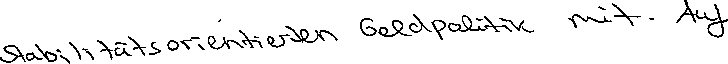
stabilitätsorientierten Geldpolitik mit. Auf
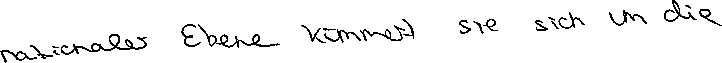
nationaler Ebene kümmert sie sich um die
